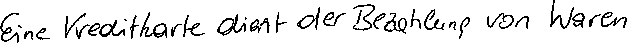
Eine Kreditkarte dient der Bezahlung von Waren
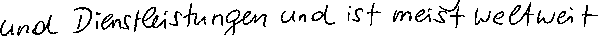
und Dienstleistungen und ist meist weltweit
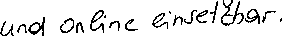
und online einsetzbar.
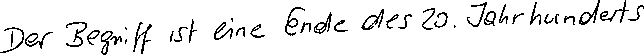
Der Begriff ist eine Ende des 20. Jahrhunderts
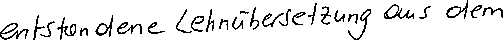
entstandene Lehnübersetzung aus dem
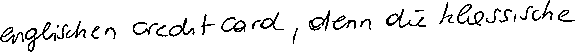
englischen creditcard, denn die klassische
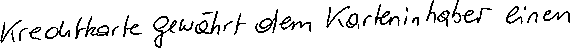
Kreditkarte gewährt dem Karteninhaber einen
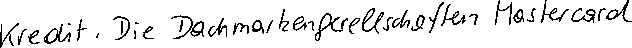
Kredit. Die Dachmarkengesellschaften Mastercard
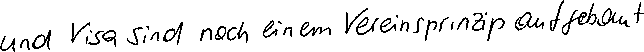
und Visa sind nach einem Vereinsprinzip aufgebaut
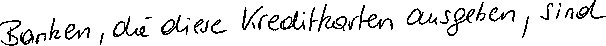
Banken, die diese Kreditkarten ausgeben, sind
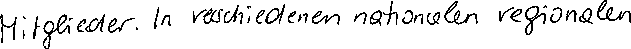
Mitglieder. In verschiedenen nationalen, regionalen
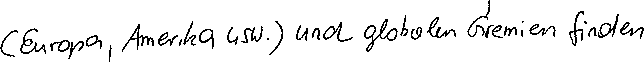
(Europa, Amerika usw.) und globalen Gremien finden
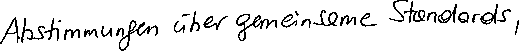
Abstimmungen über gemeinsame Standards,
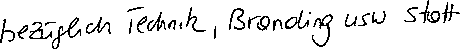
, bezüglich Technik, Branding usw. statt
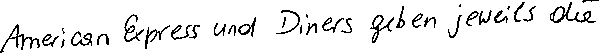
American Express und Diners geben jeweils die
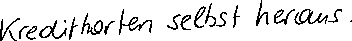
Kreditkarten selbst heraus.
